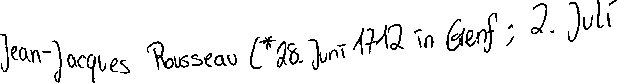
Jean-Jacques Rousseau (* 28. Juni 1712 in Genf; 2. Juli
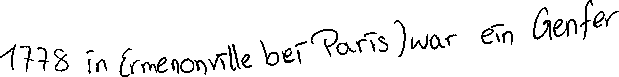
1778 in Ermenonville bei Paris) war ein Genfer
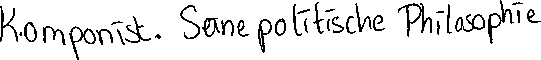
Komponist. Seine politische Philosophie
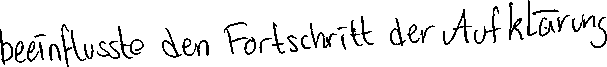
beeinflusste den Fortschritt der Aufklärung
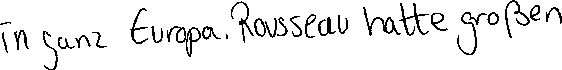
in ganz Europa. Rousseau hatte großen
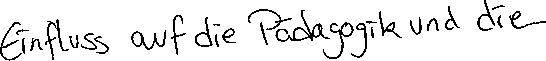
Einfluss auf die Pädagogik und die
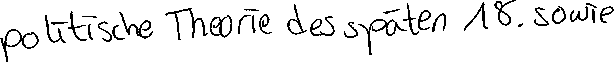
politische Theorie des späten 18. sowie
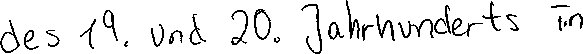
des 19. und 20. Jahrhunderts in
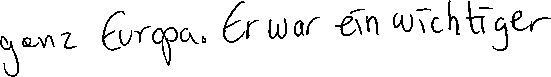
ganz Europa. Er war ein wichtiger
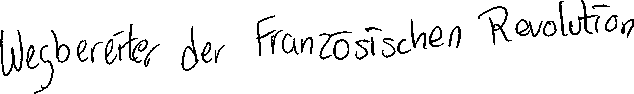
Wegbereiter der Französischen Revolution.
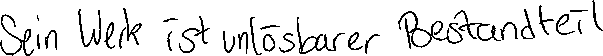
Sein Werk ist unlösbarer Bestandteil
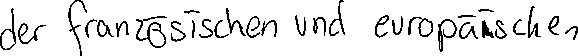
der französischen und europäischen
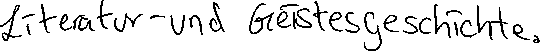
Literatur- und Geistesgeschichte.
